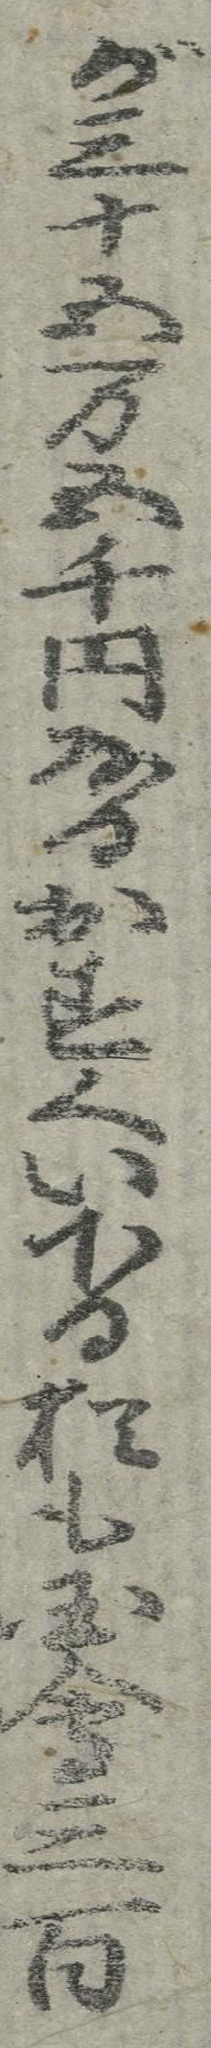が三十五万五千円なるおすくい下る猶も国会三百
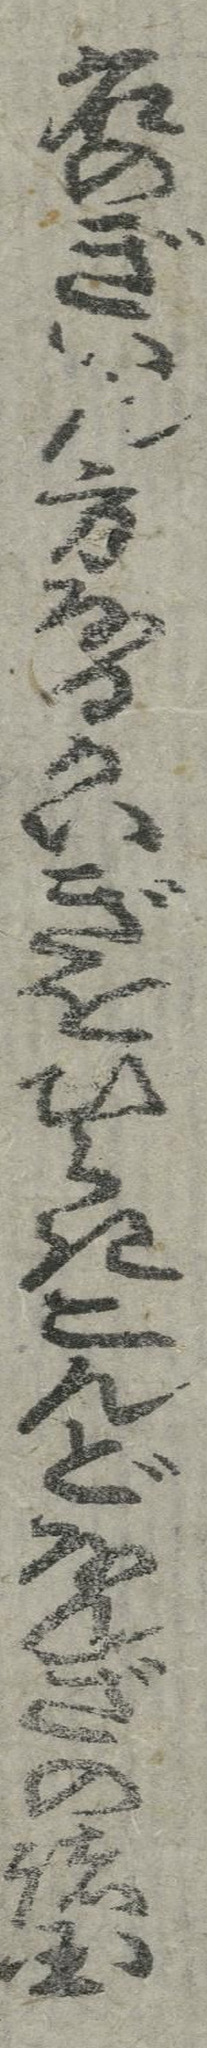名のぎいん方なるかいぎをひらきこんどなんぎの諸国
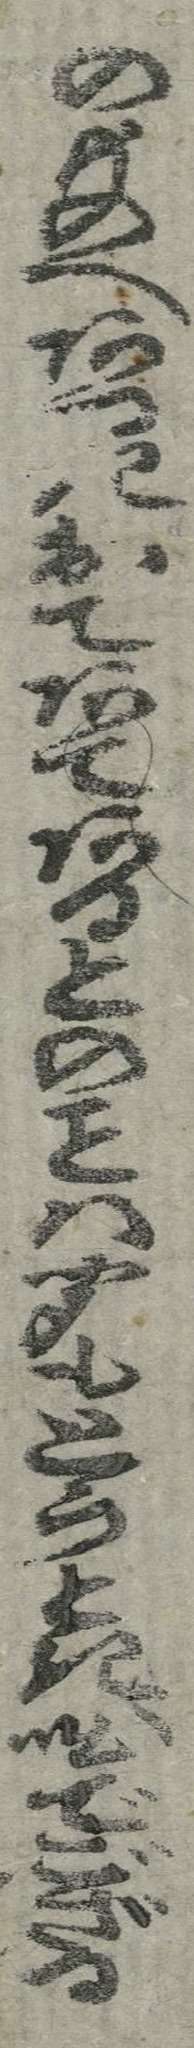のものへあつきおてあてあるとのことは聞もとうとき咄でござる
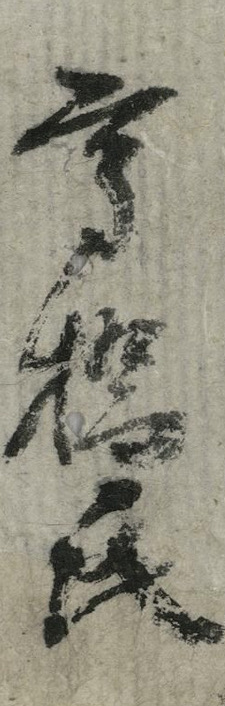高橋氏
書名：十二ヶ国大地しんくどき
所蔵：東京大学地震研究所図書室 Earthquake Research Institute Library, The University of Tokyo, JAPAN
